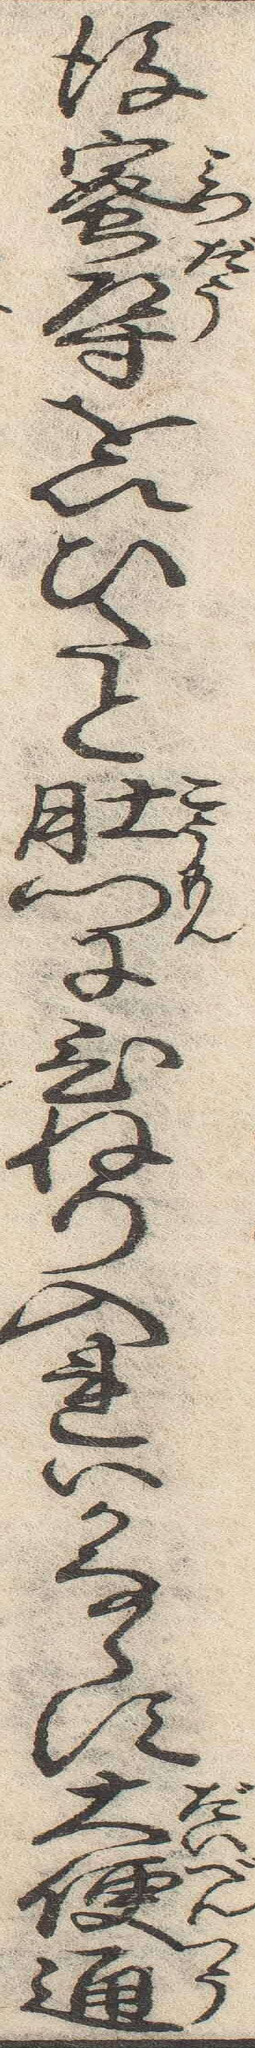後蜜導を以ひたと肚門にひねり入れいかならす大便通
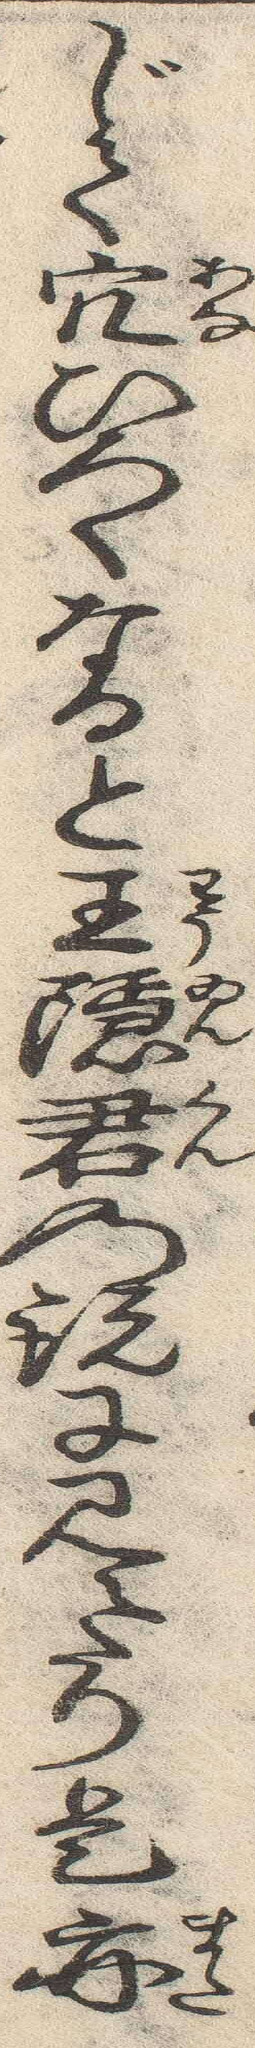じて穴ひろくなると王隠君の説に見えたり是亦
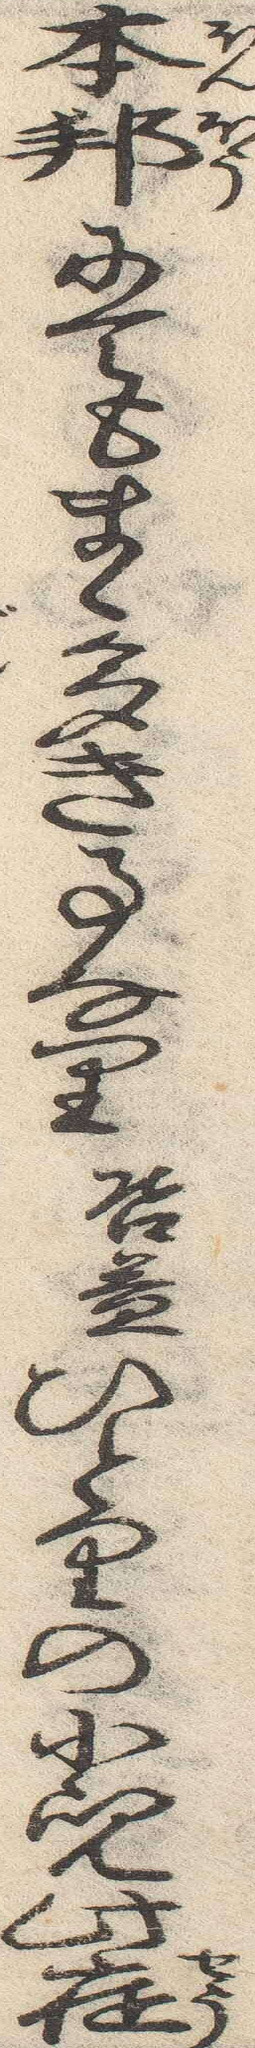本邦にてもまゝ多き事なり啓益ひとりの小児此症
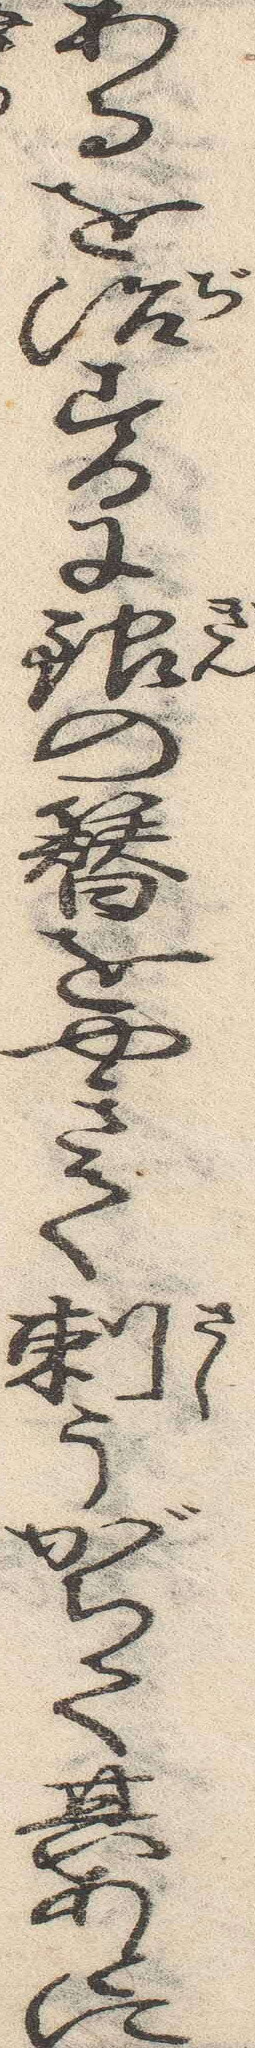あるを治するに銀の簪をやきて刺うがちて其あとに
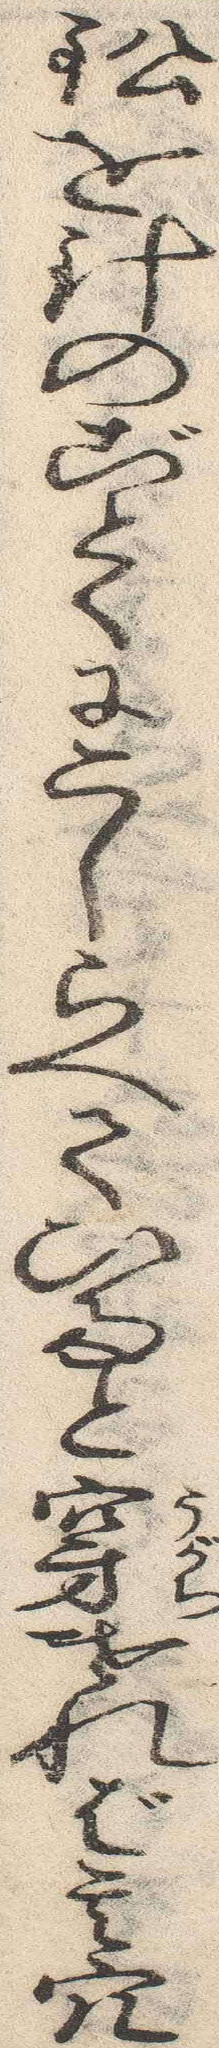鉛を針のごとくにこしらへてひたと穿ければ其穴
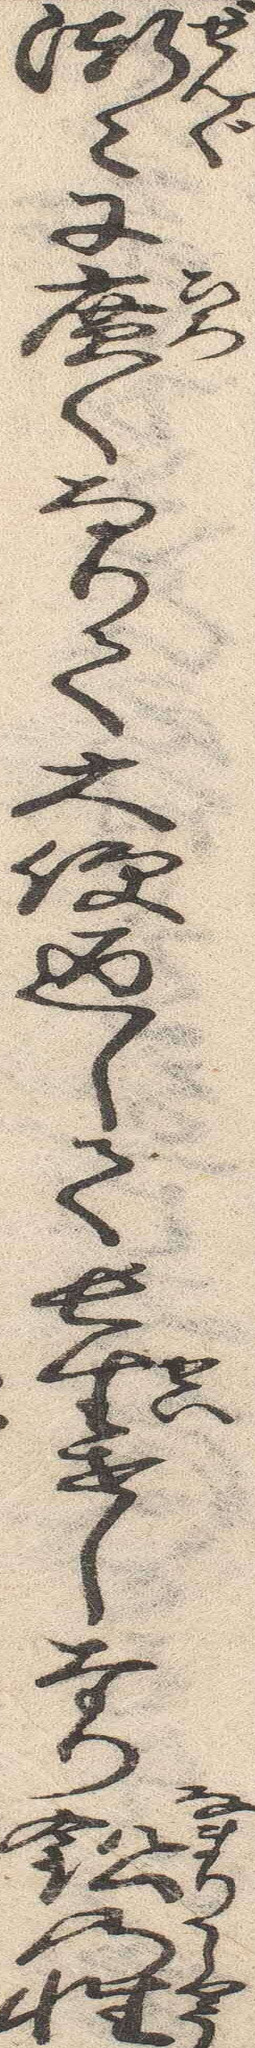漸〻に廣くなりて大便通して長生せしなり鉛の性
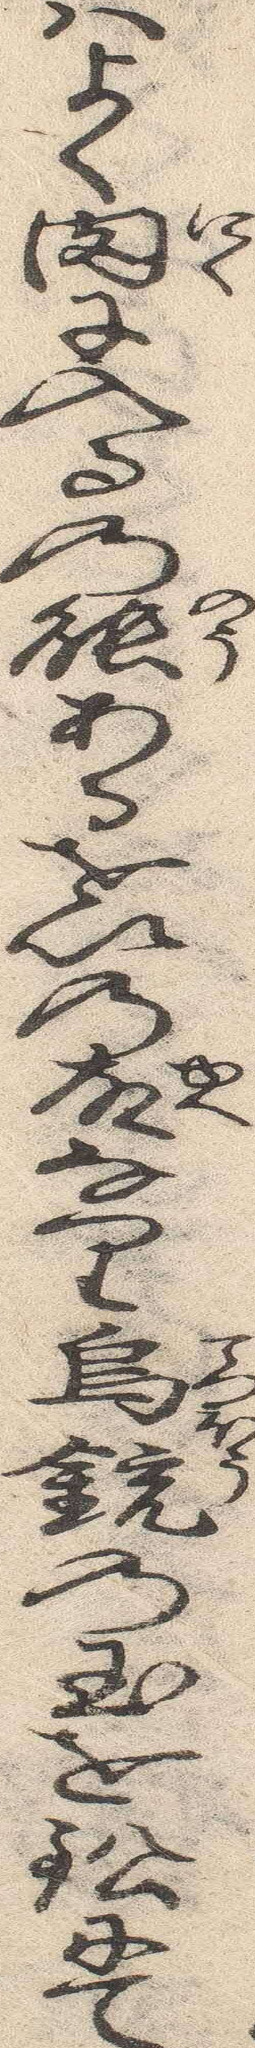はよく肉に入るの能あるを以の故なり烏銃の玉を鉛にて
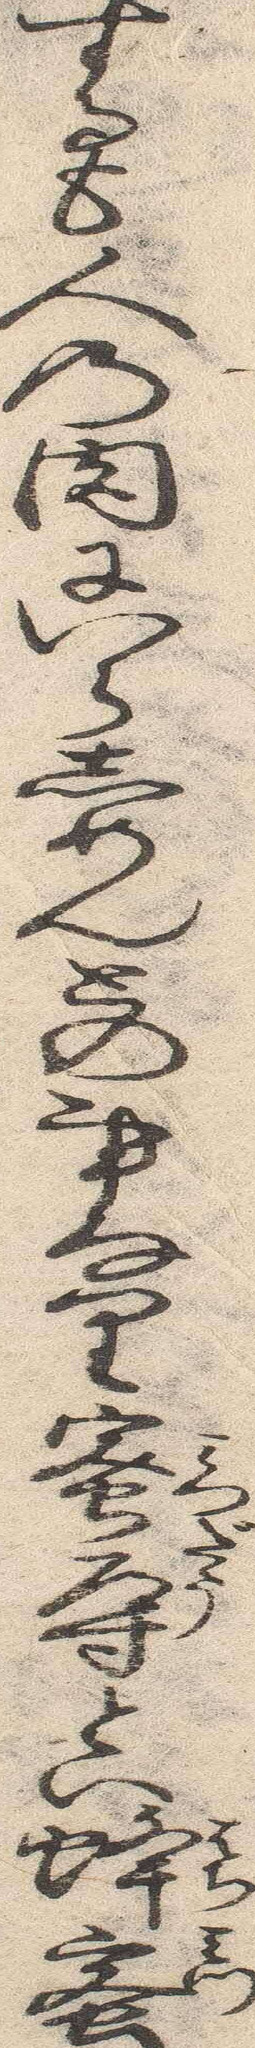するも人の肉にいらしめんとの事なり蜜導とは蜂蜜
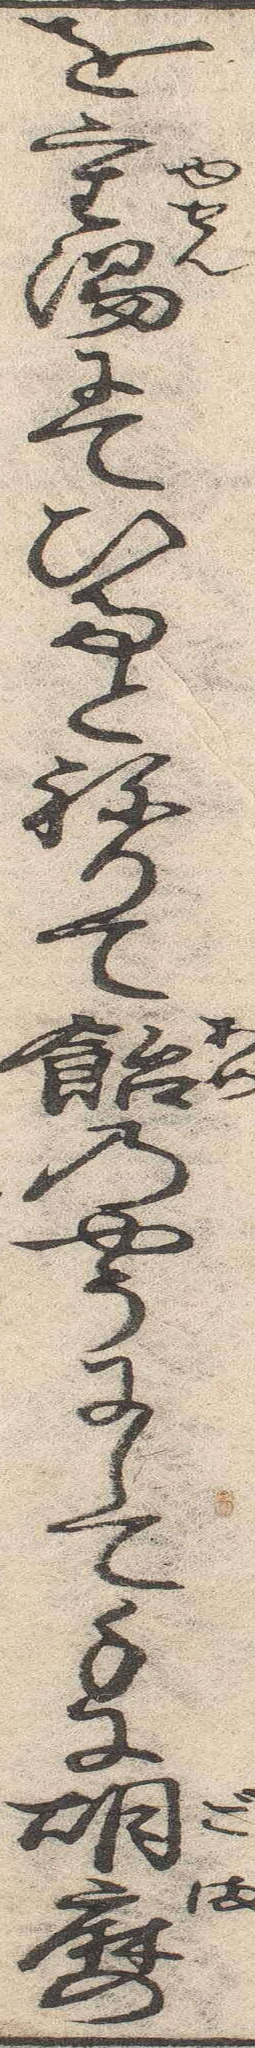を重湯にてひたとねりて飴のやうにして手に胡麻の
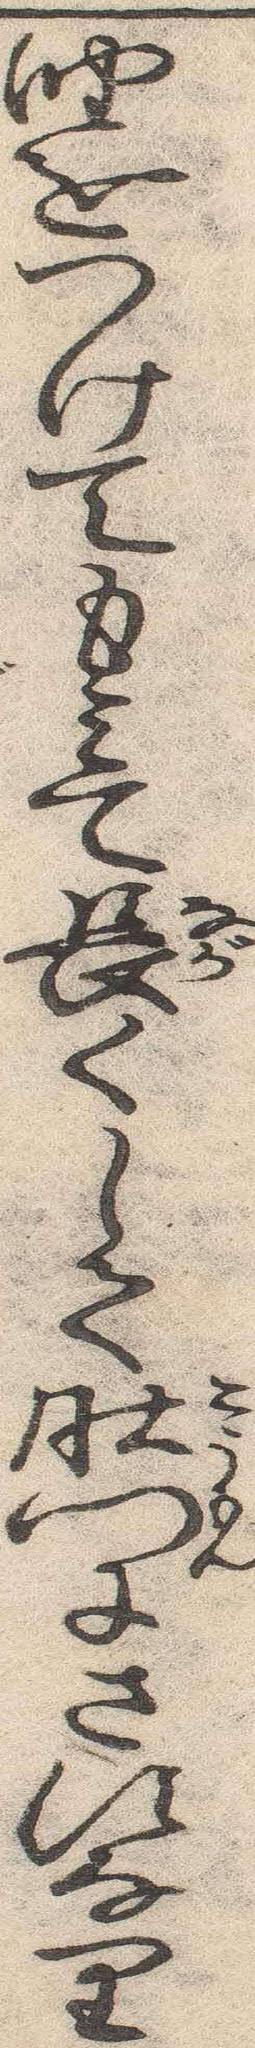油をつけてもみて長くして肚門にさすなり
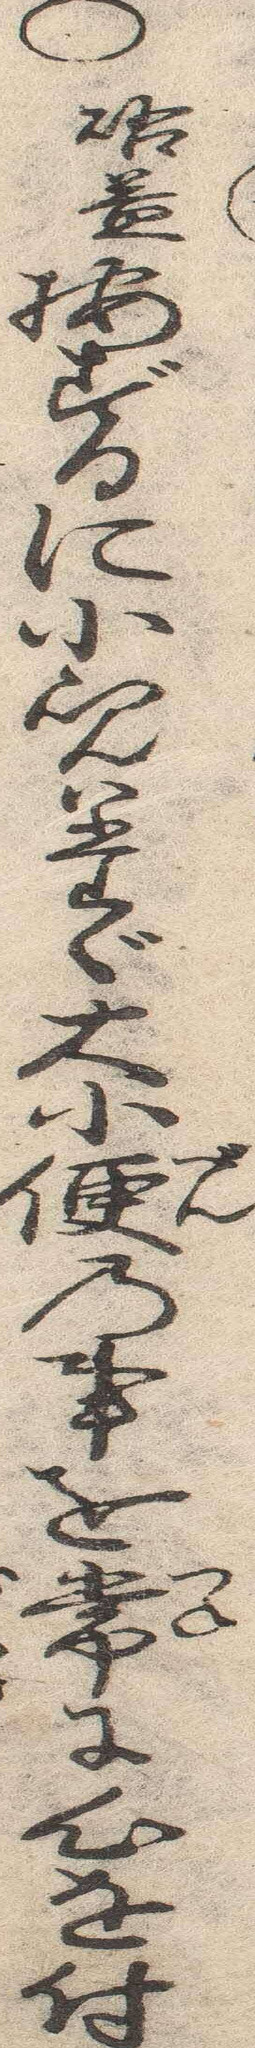◯啓益按ずるに小児はたゞ大小便の事を常に心を付
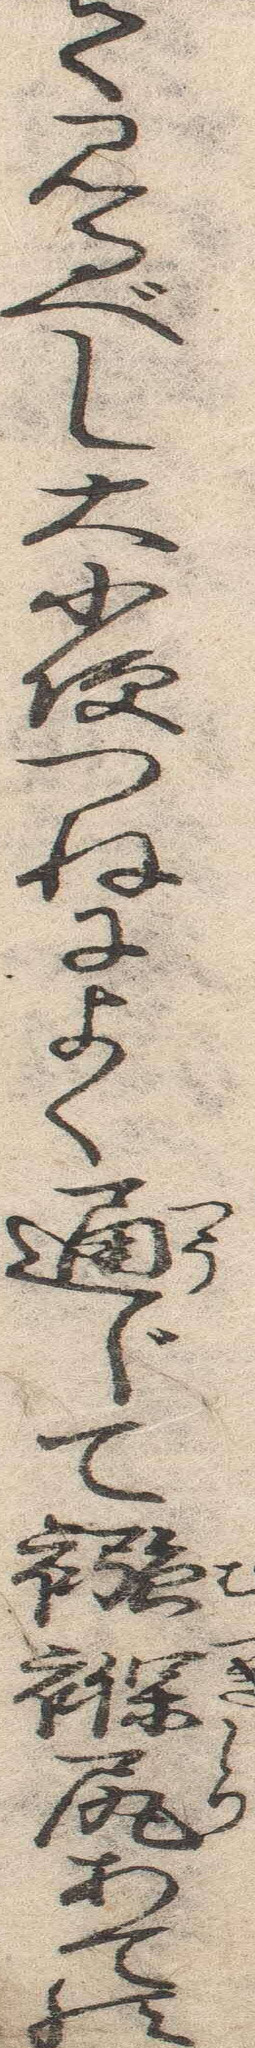て見るべし大小便つねによく通じて襁褓尻あての
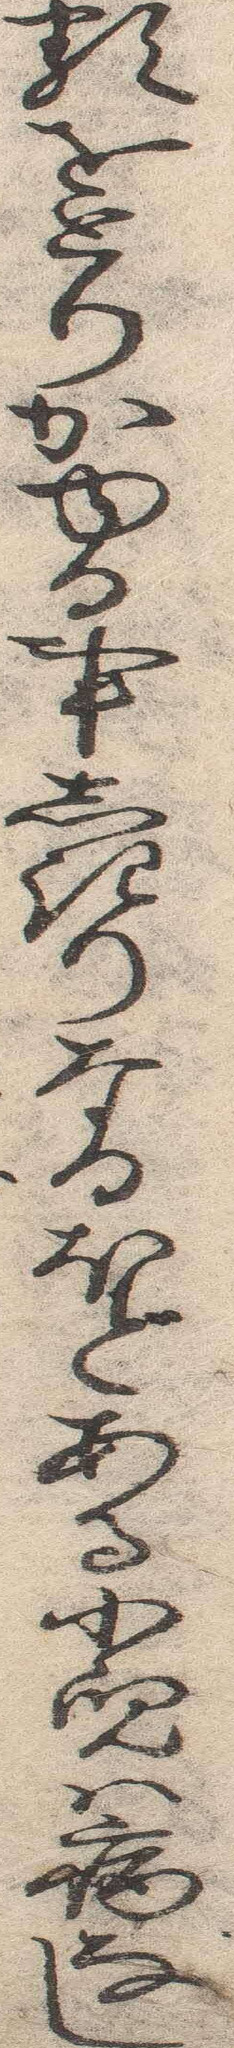類をとりかゆる事しきりなるほどある小児は病なし
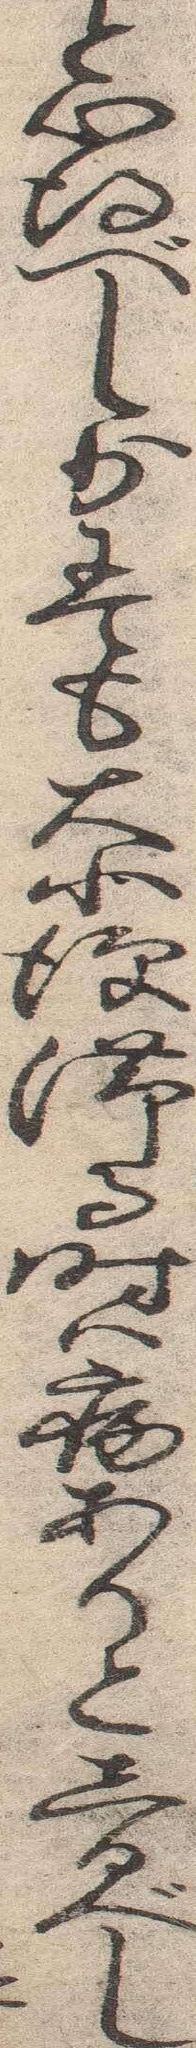と心得べし少にても大小便滞る時は病ありとしるべし
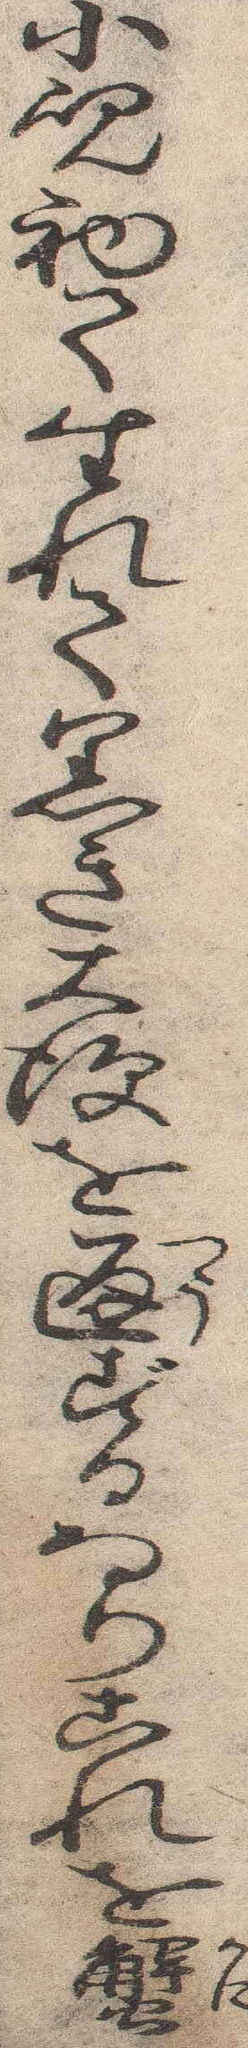小児初て生れて黒き大便を通ずるなりこれを蟹

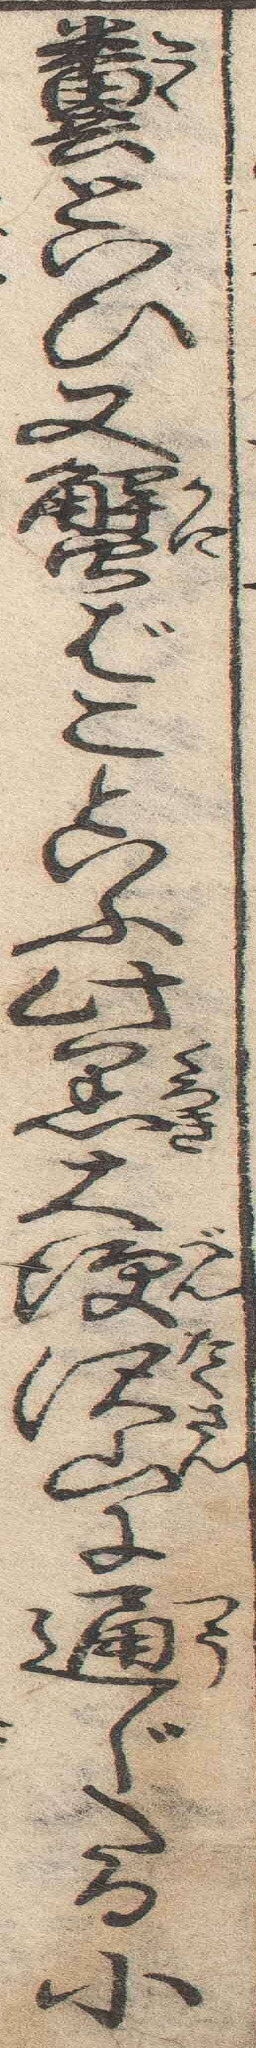糞といひ又蟹ばこといふ此黒大便沢山に通じたる小
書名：小児必用養育草
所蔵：東京学芸大学附属図書館 国文学研究資料館
